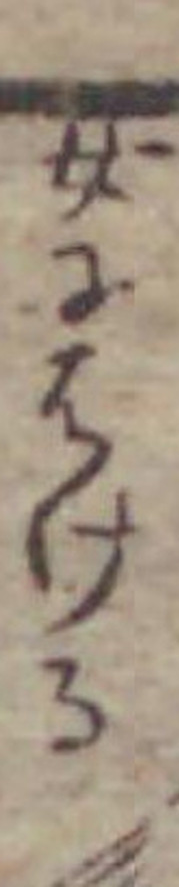女にはける
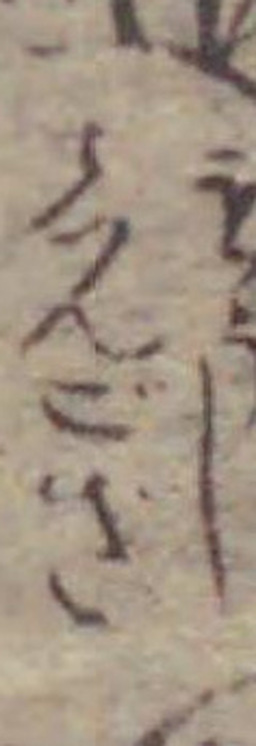しんごさ
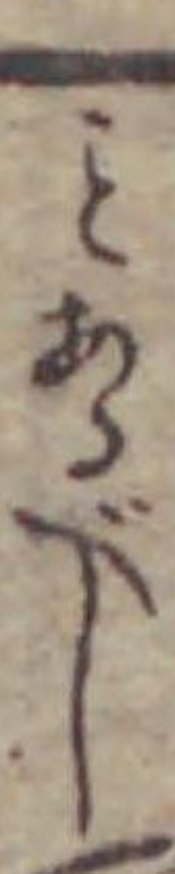ものあるべし
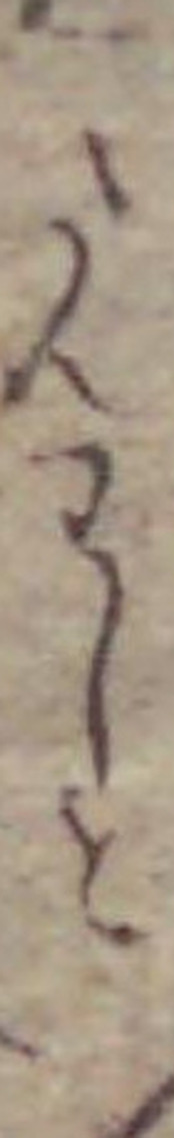さんわしを
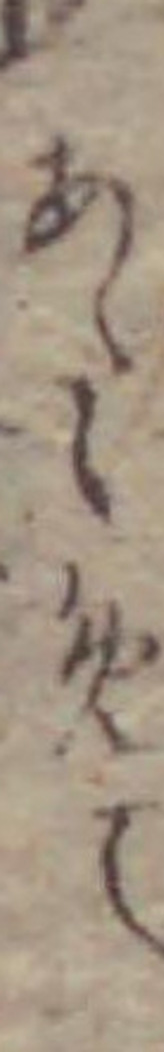あたゝめて

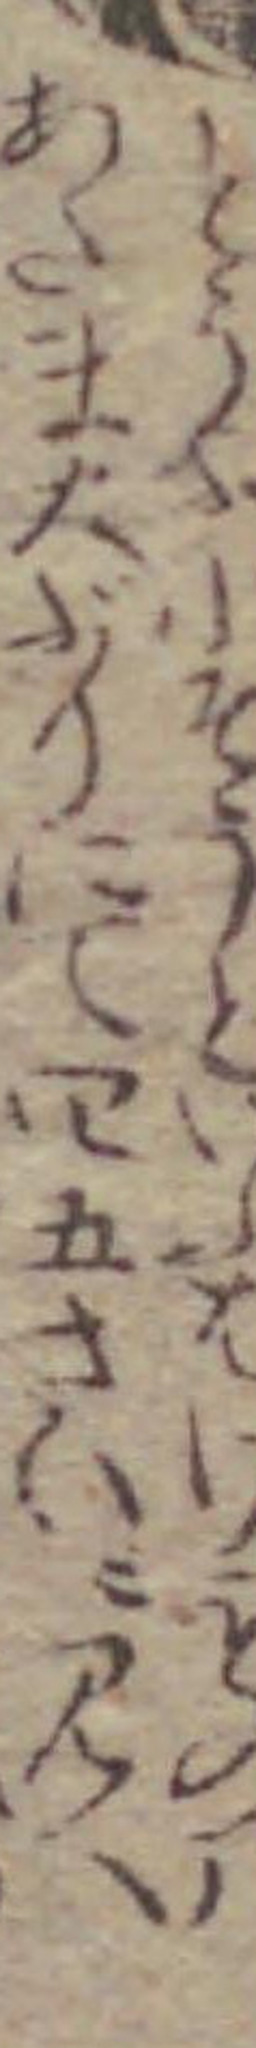あたま大ぶりにて四五さいに見へ
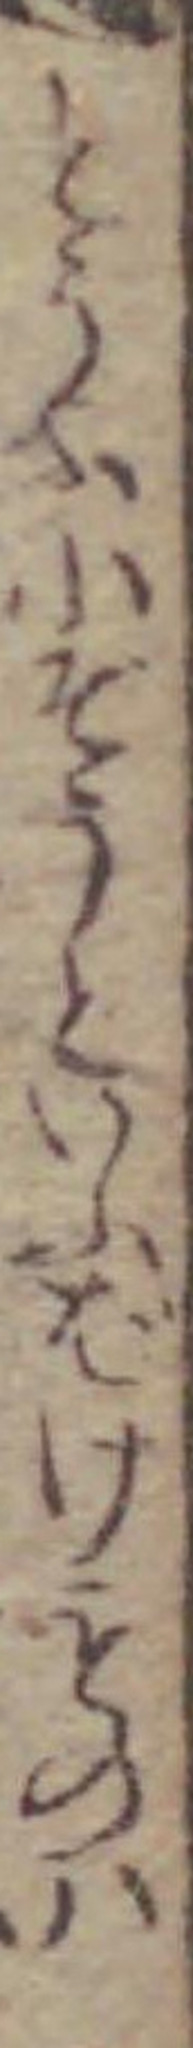とうふ小ぞうといふばけものは
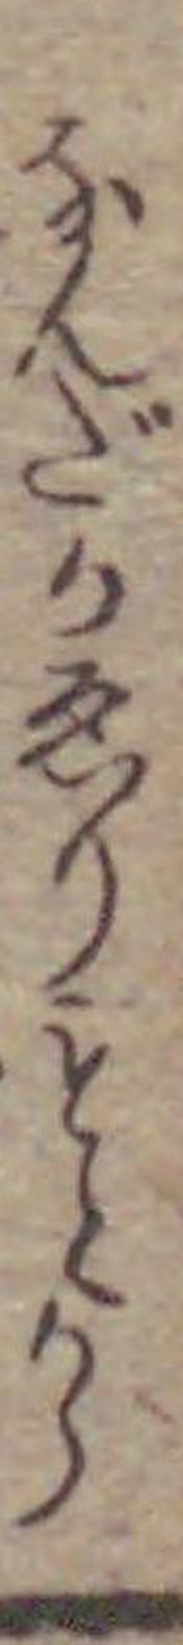なんだかゑりもとから
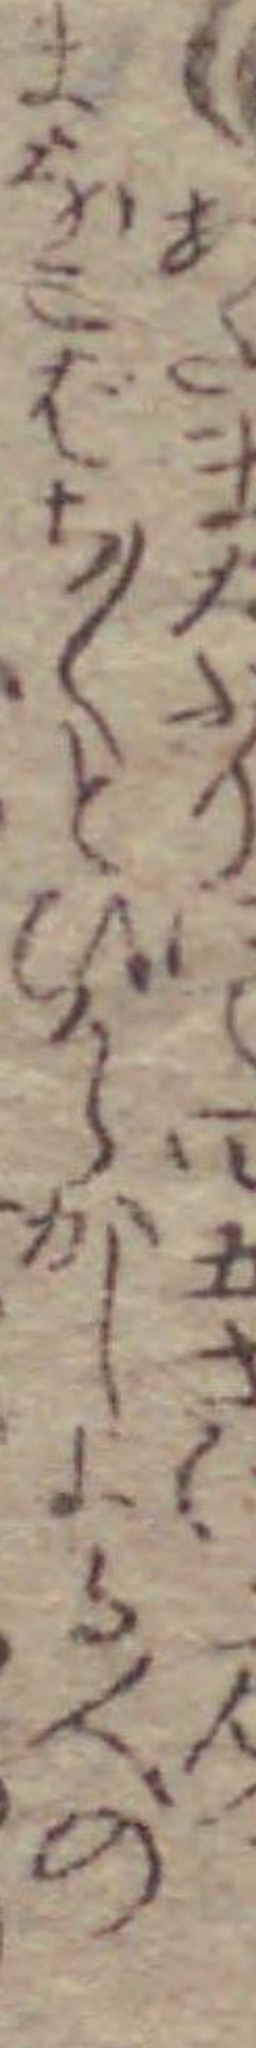まなこばち〳〵とひからかしよる人の
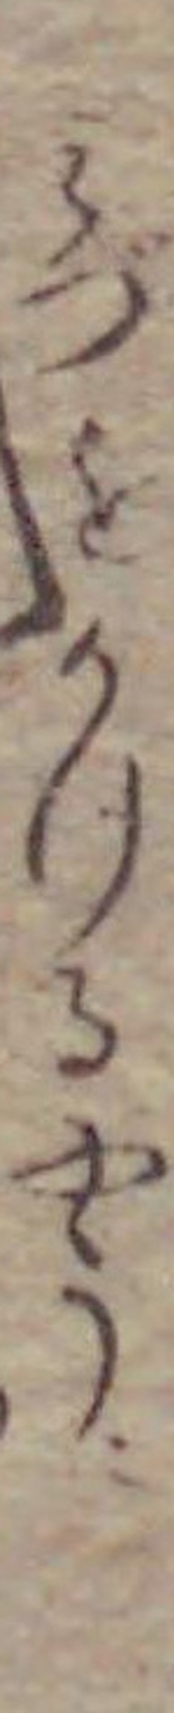みづをかけるやうに
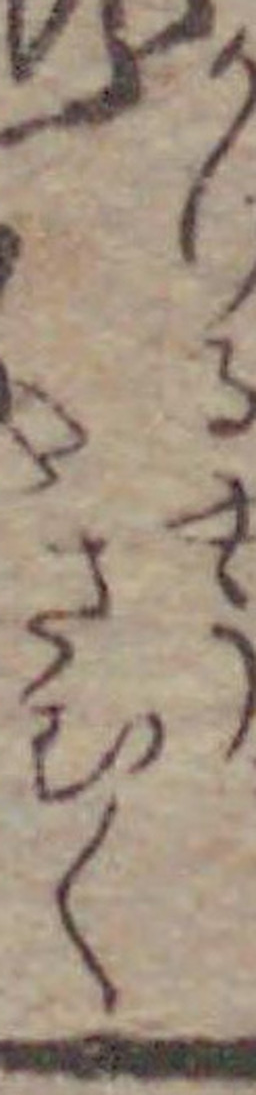さむく
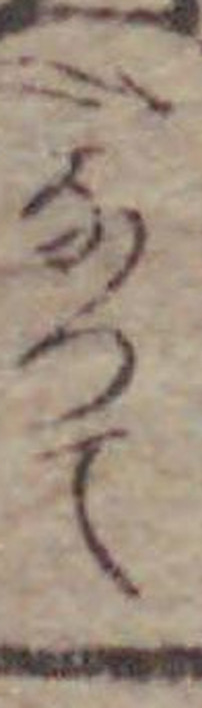なつて
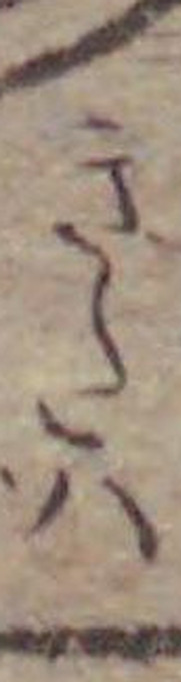きたは
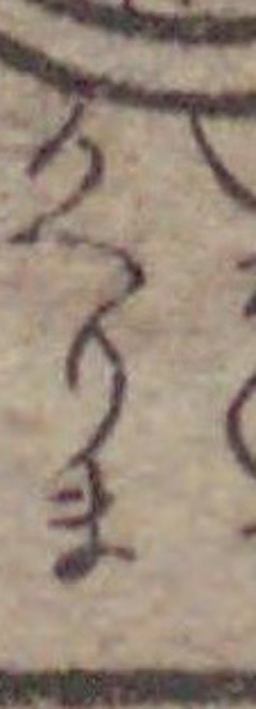かへりま
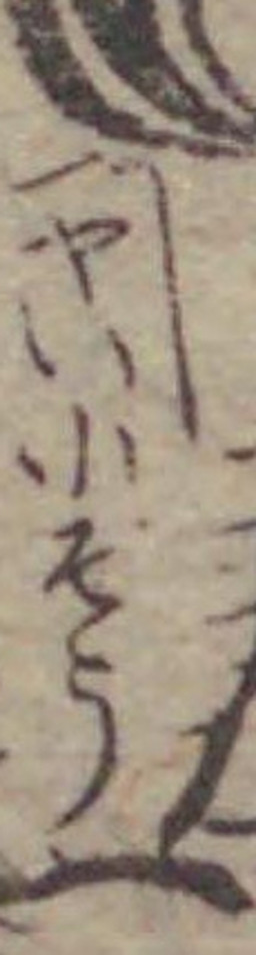〽やい小そう
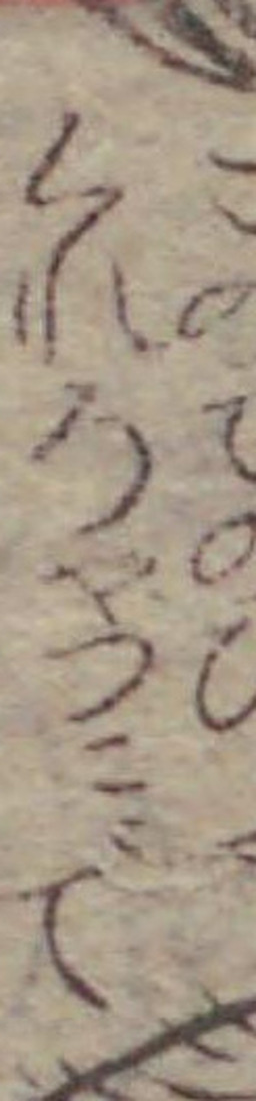くれろやつこにて
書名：妖怪仕内評判記 : 2巻
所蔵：国立国会図書館 National Diet Library, JAPAN
